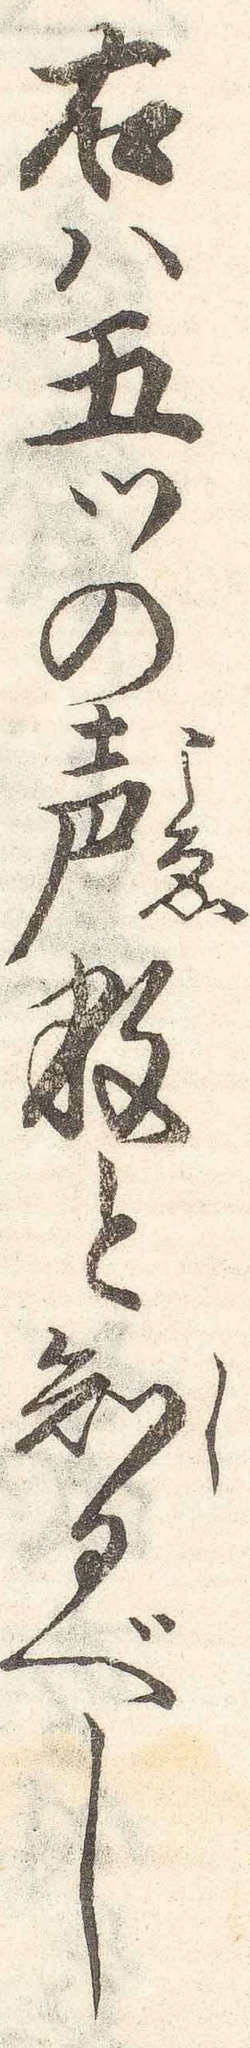右は五ッの声数と知るべし
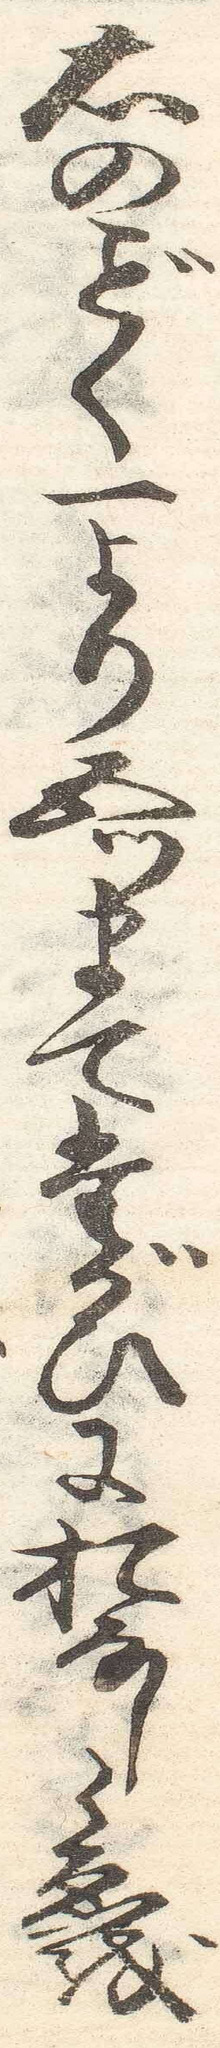右のごとく一より五ッまてたがひにおなしこゑを
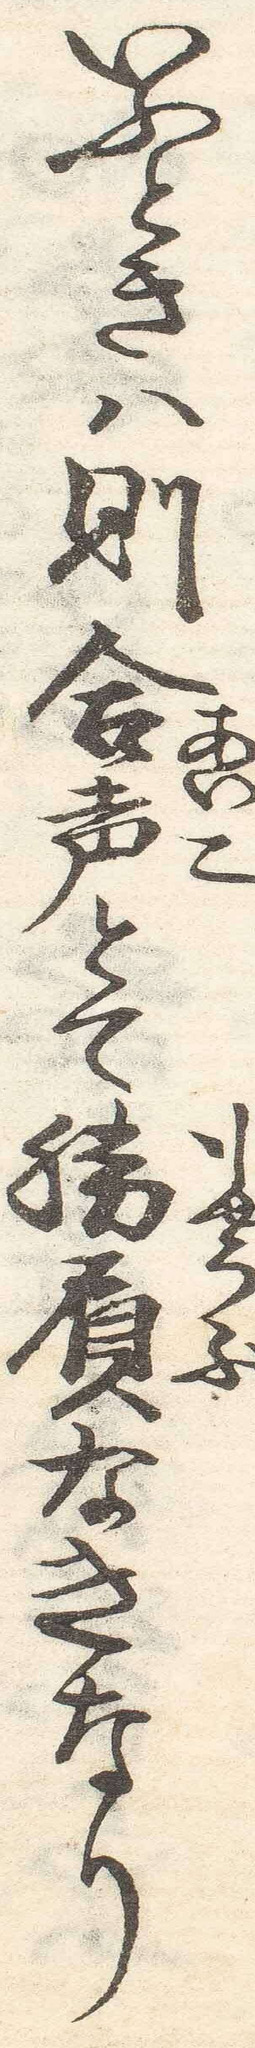いふときは則合声とて勝負なきなり
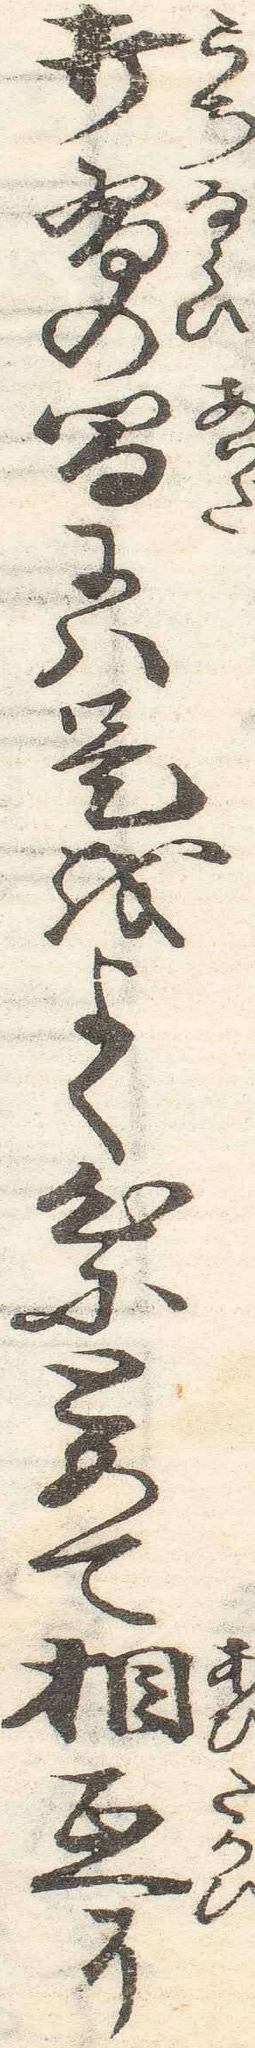打習の間には是をよくこ心にとめて相互に
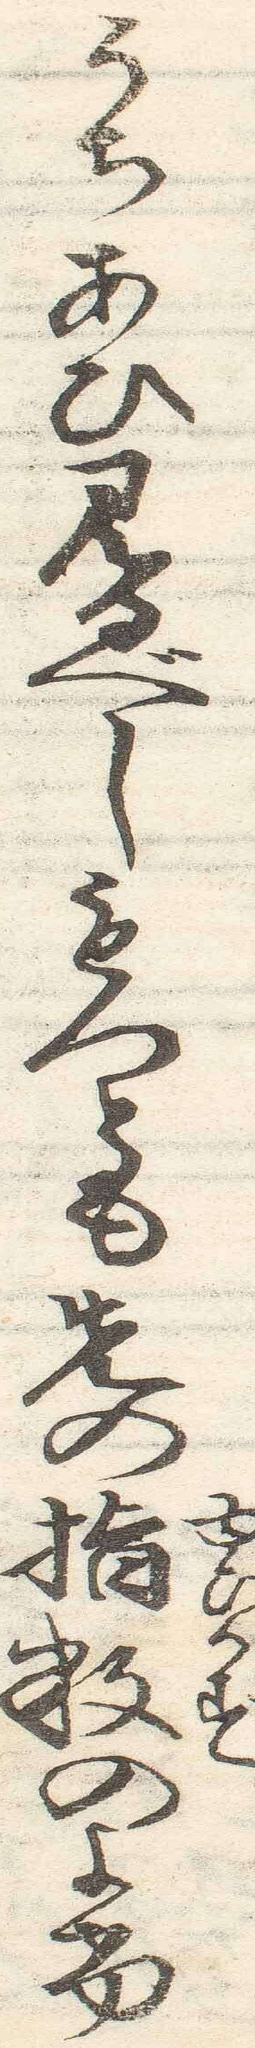うちあひ見るべしもつとも先の指数のよけ
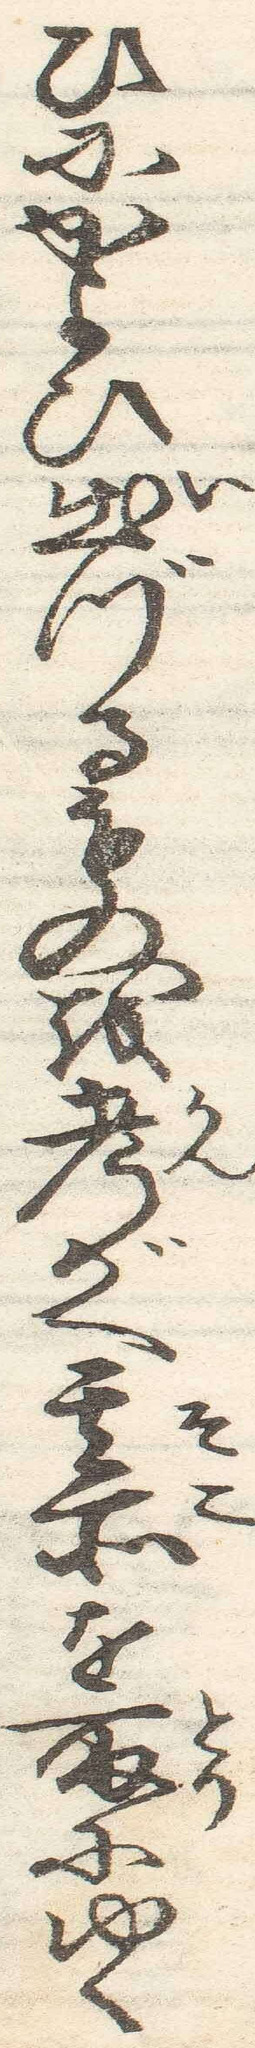ひにかよひ出づるものを考がへ其所を取にゆく
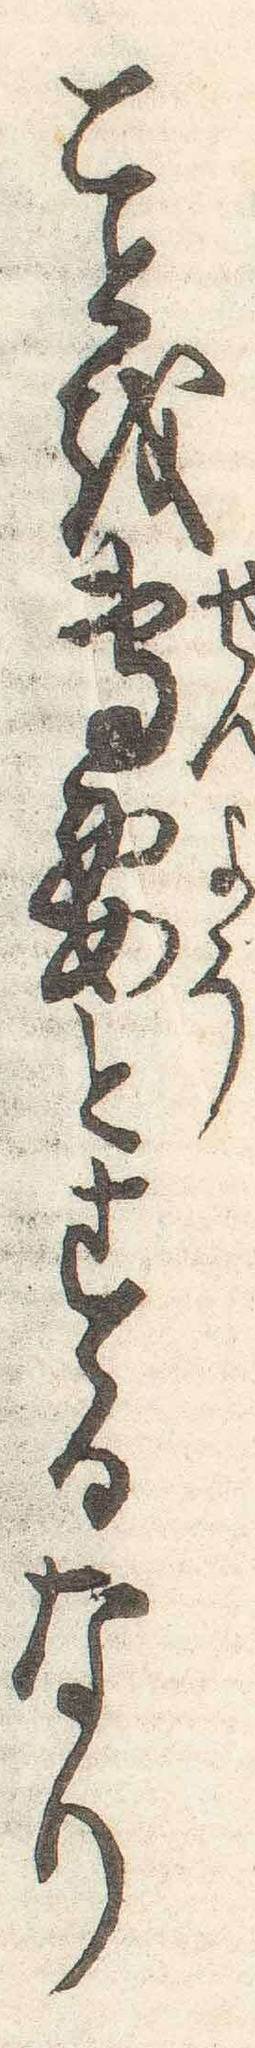ことを専要とするなり

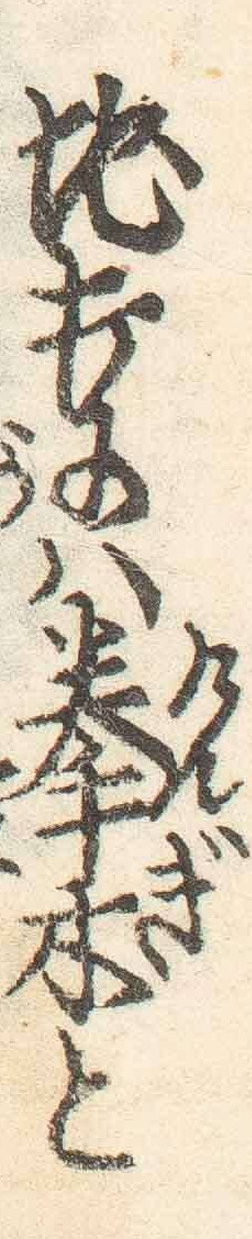地打には拳木と
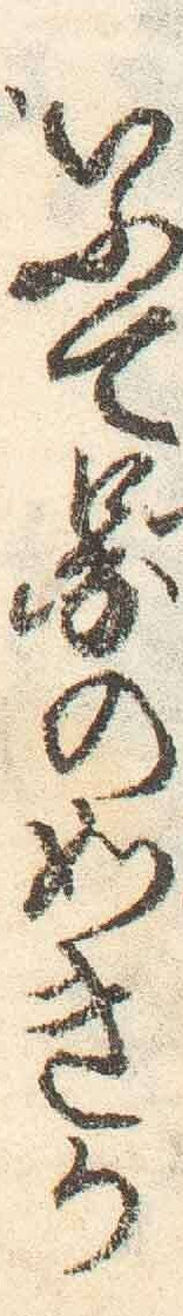いふて図の如きか
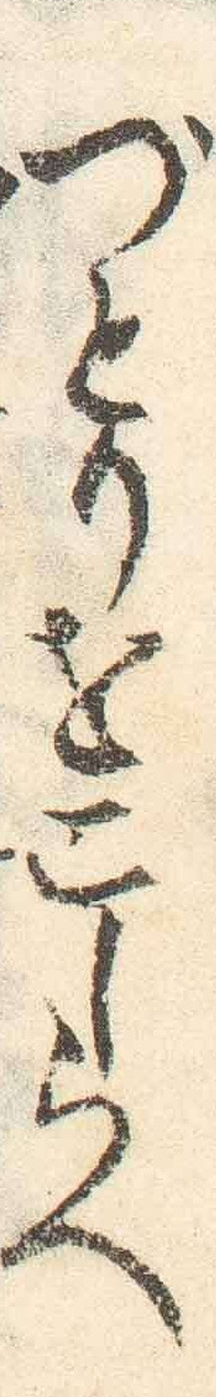づとりをこしらへ
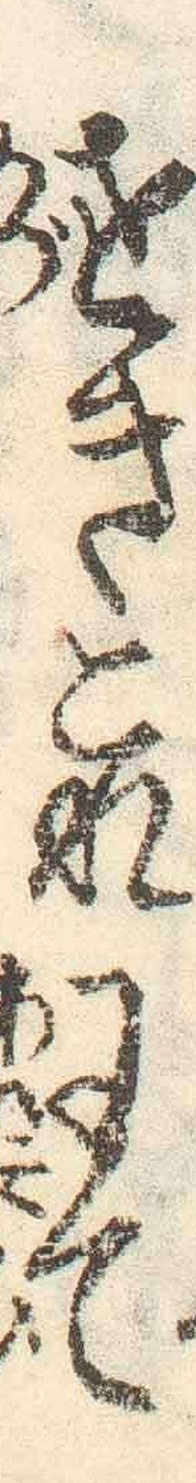をきこれにて
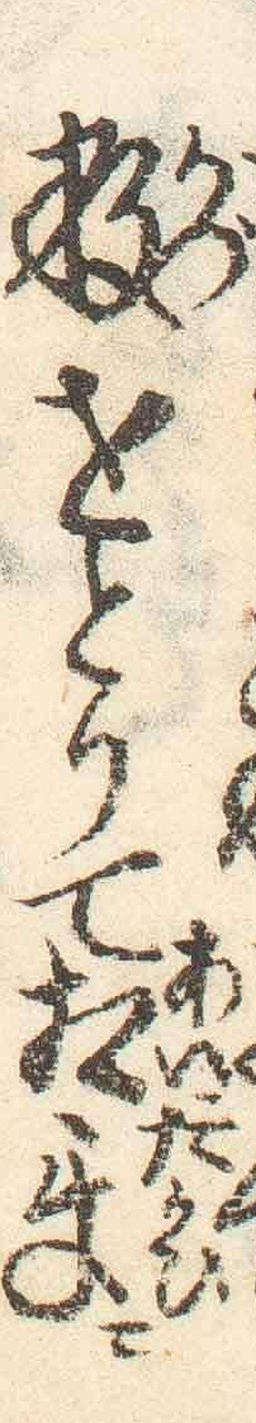数をとりて相互に
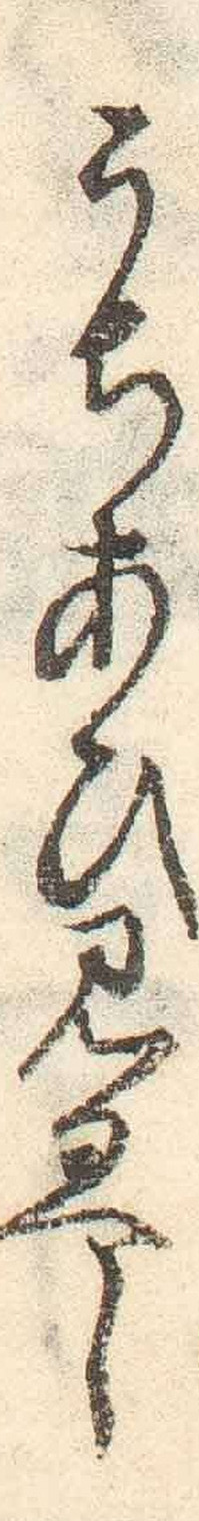うちあひ見るへし
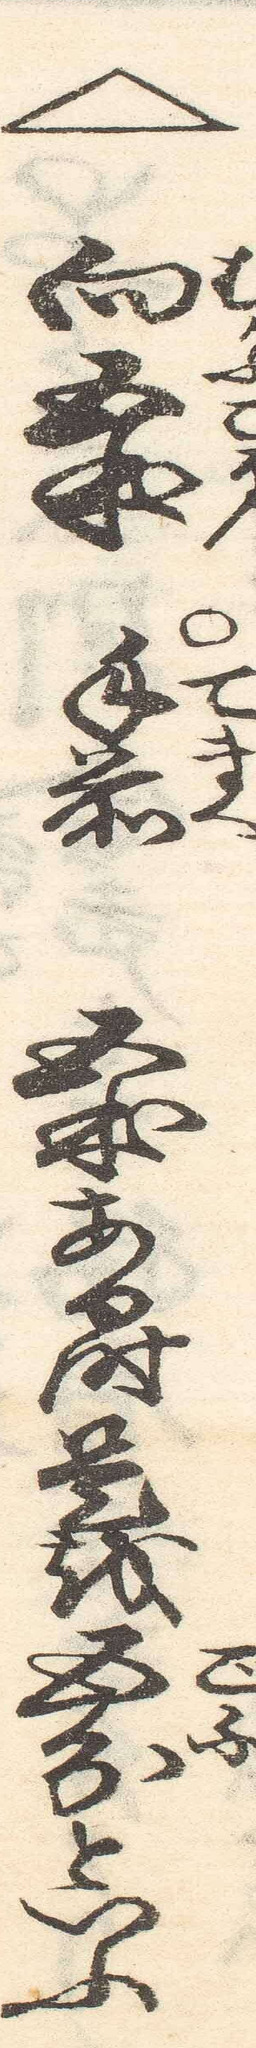△向五本手前五本ある時是を五分といふ
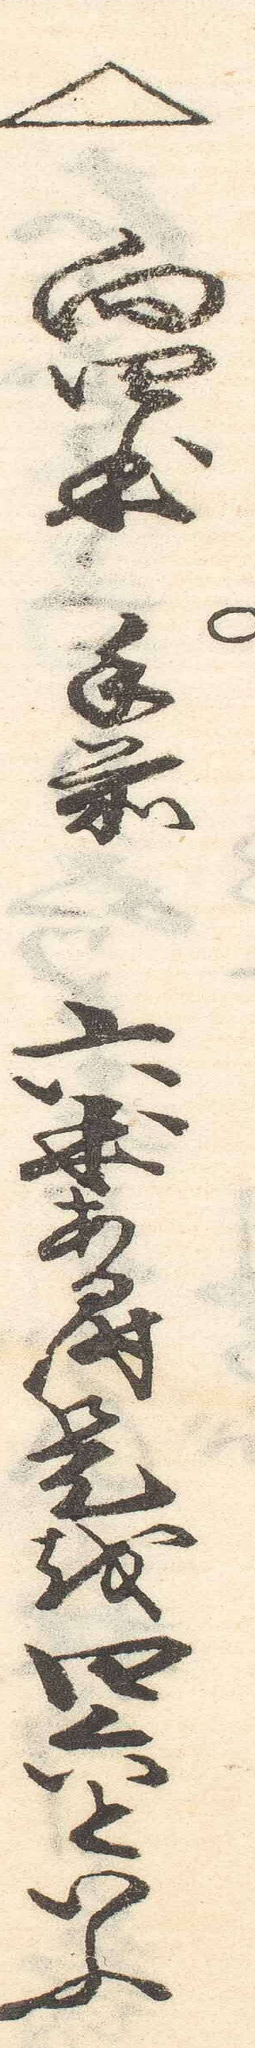△向四本手前六本ある時是を四六といふ
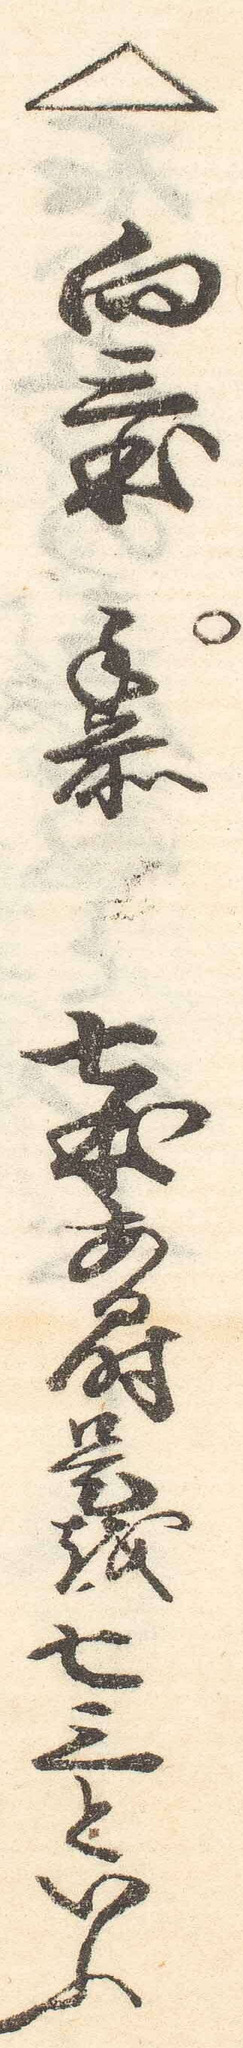△向三本手前七本ある時是を七三といふ
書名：拳独稽古
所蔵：東京学芸大学附属図書館 国文学研究資料館
